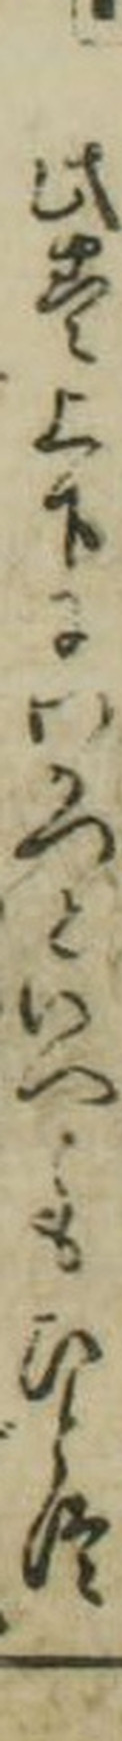此巻上下にわかつといへともひとつ
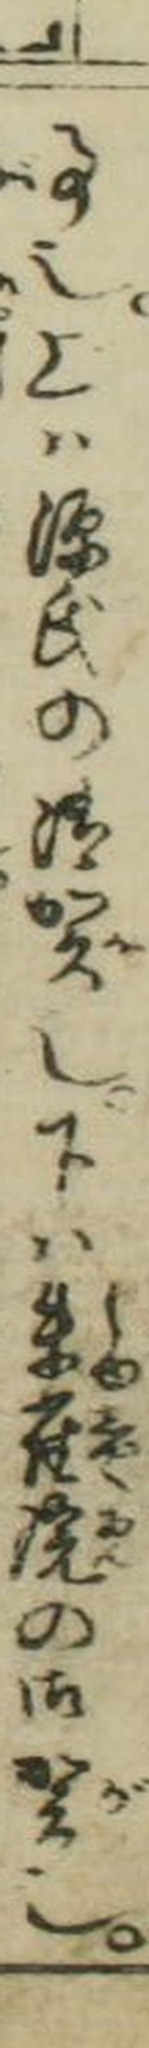事也。上は源氏の御賀也。下は朱雀院の御賀也。
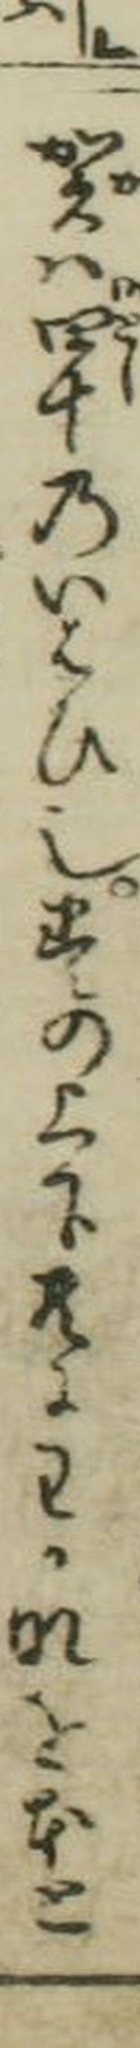賀は四十のいはひ也。巻の上下共にわかなを本と
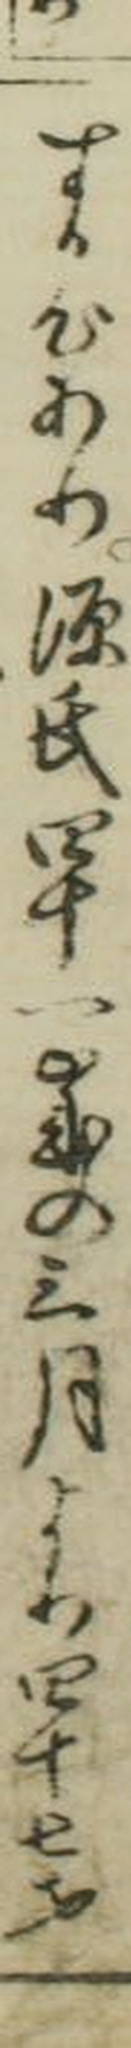する心あり。源氏四十一歳の三月より四十七才
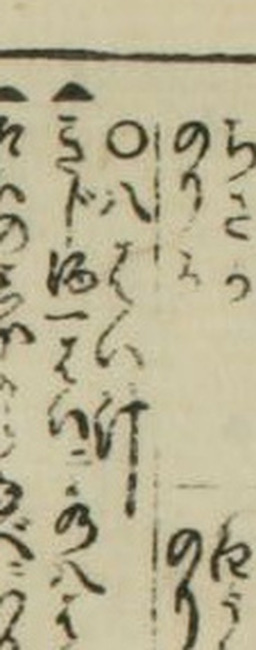◯八はい汁
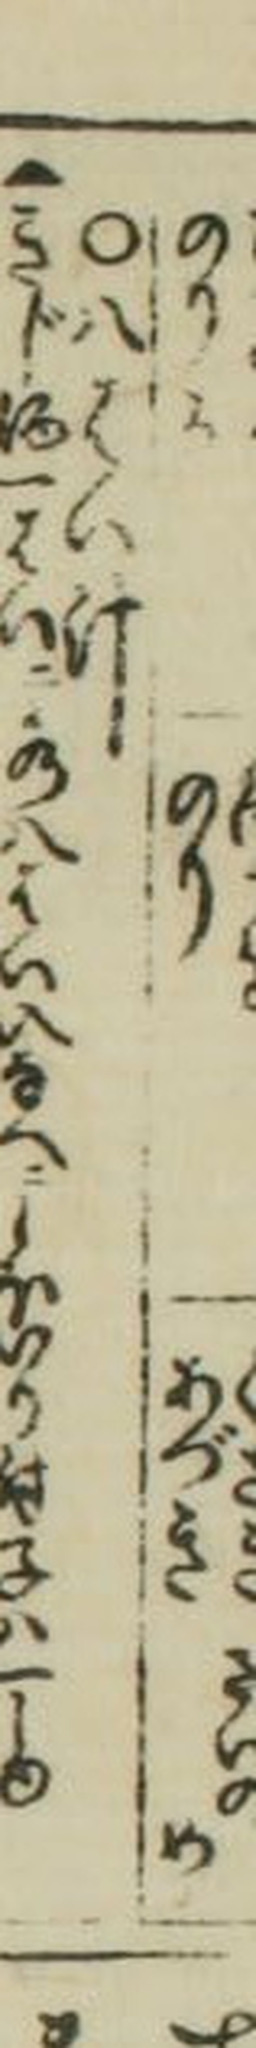▲きじ酒一はい水八はい入なへしほいり付ねは一しゆ
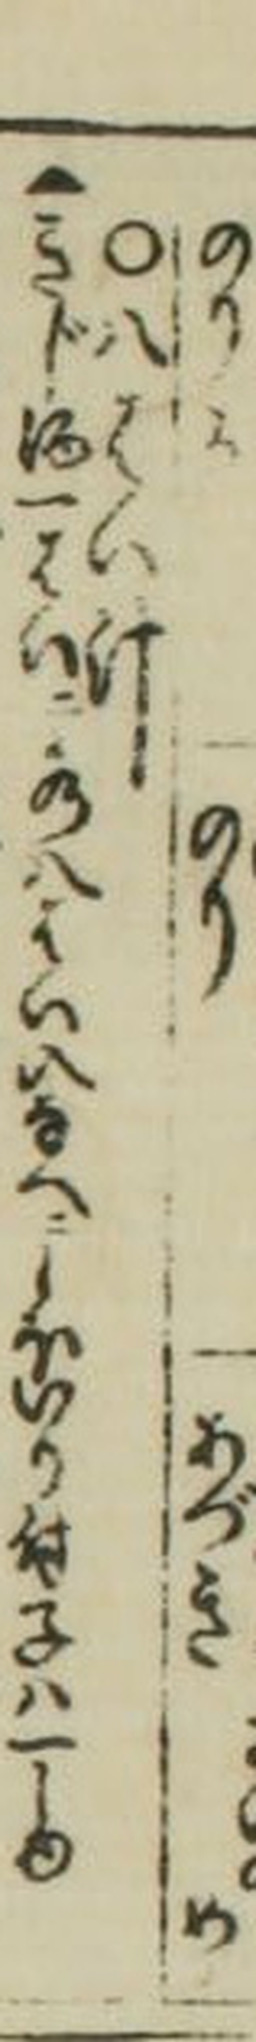▲きじ酒一はい水八はい入なへしほいり付ねは一しゆ
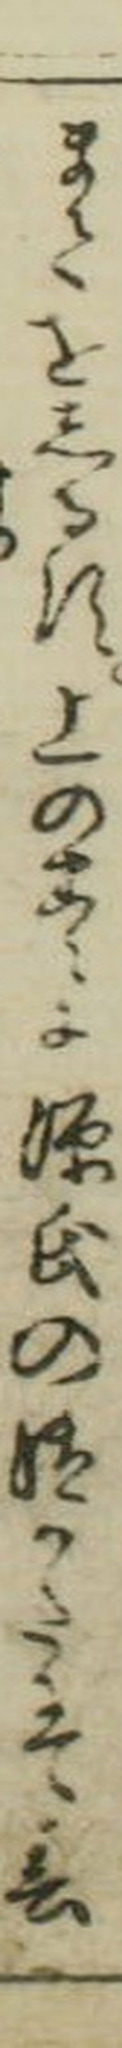まてをしるす。上の巻に源氏の御かたにて春
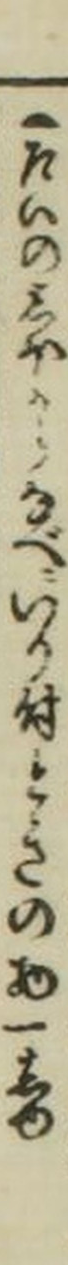▲たいのしほからなべいり付ときの物一しゆ
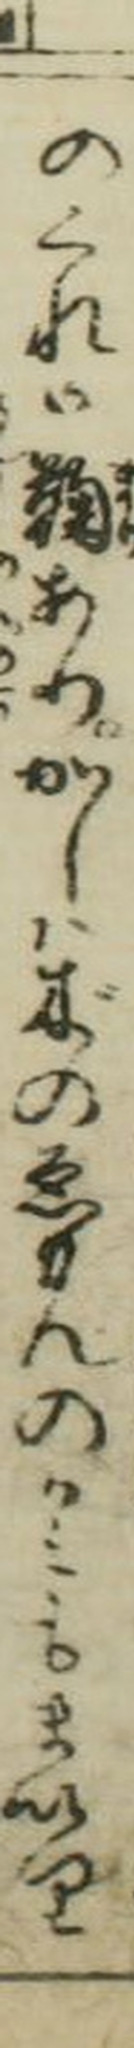のくれ御鞠あり。かしはぎのゑもんのかみもまいり
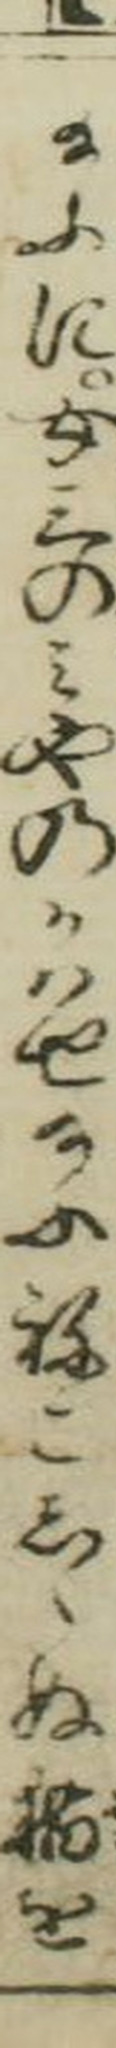給ふに。女三のみやのかはせ給ふねこしらぬ猫を
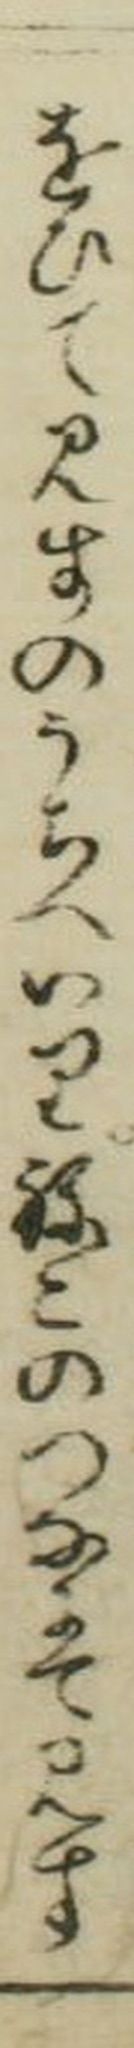をひてみすのうちへいり。ねこのつなにてみす
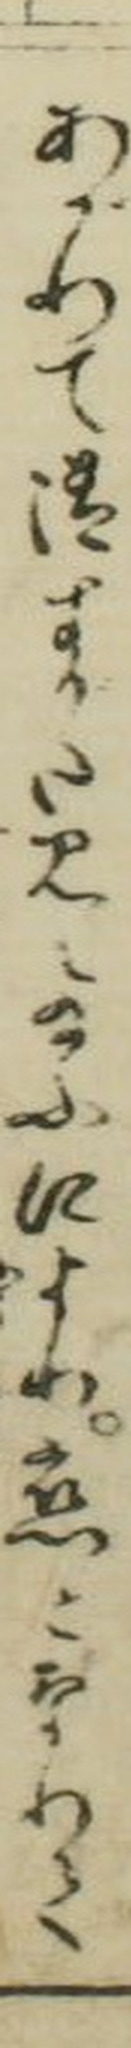あがりて御すがた見え給ふにより。恋となりて
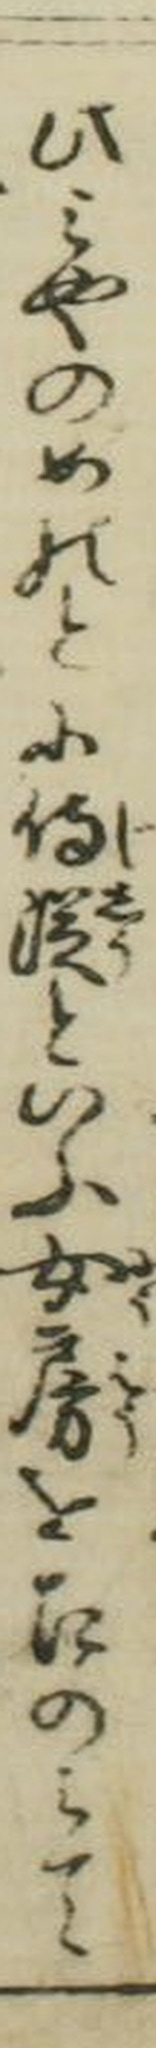此のみやのめのとに侍従といふ女房をたのみて
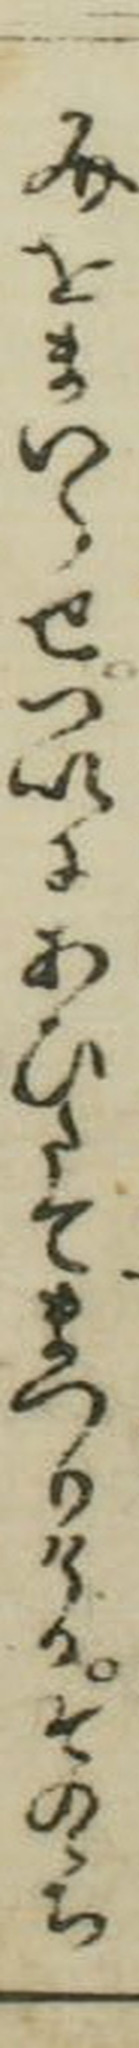文をまいらせ。ついにあひたてまつりける。そのゝち
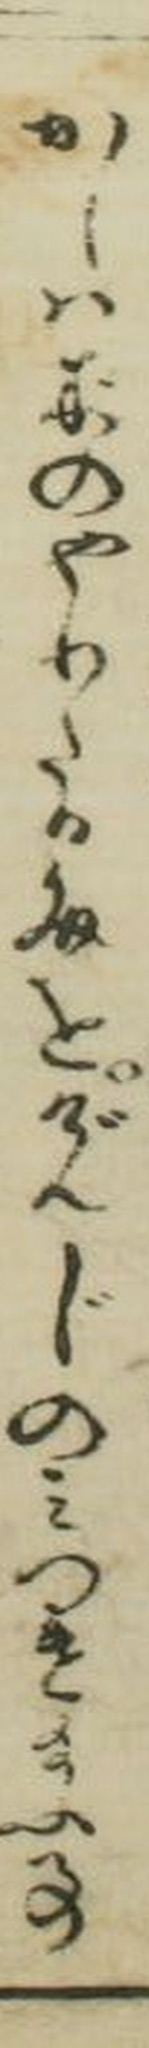かしはぎのやりたる文を。げんじのみつけ給ふ事
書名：女源氏教訓鑑
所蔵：東京学芸大学附属図書館
